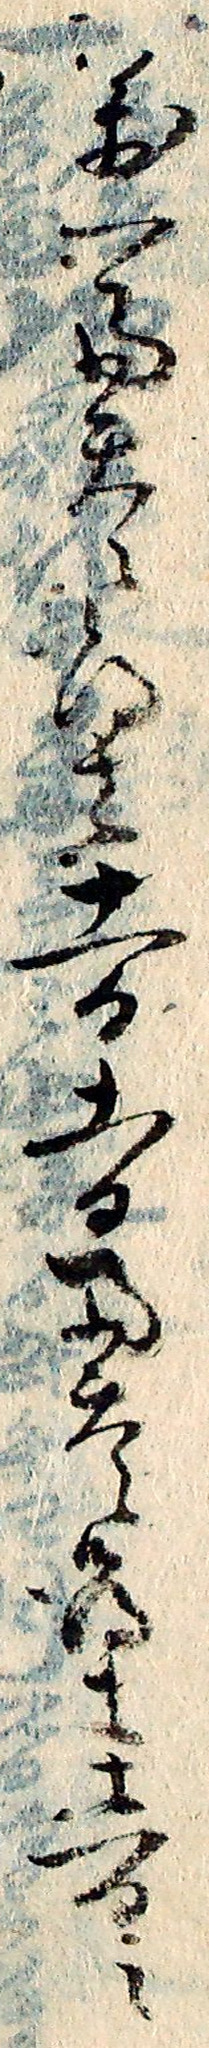万一雨天に候得は十一日十一日雨天に候得は十二日之
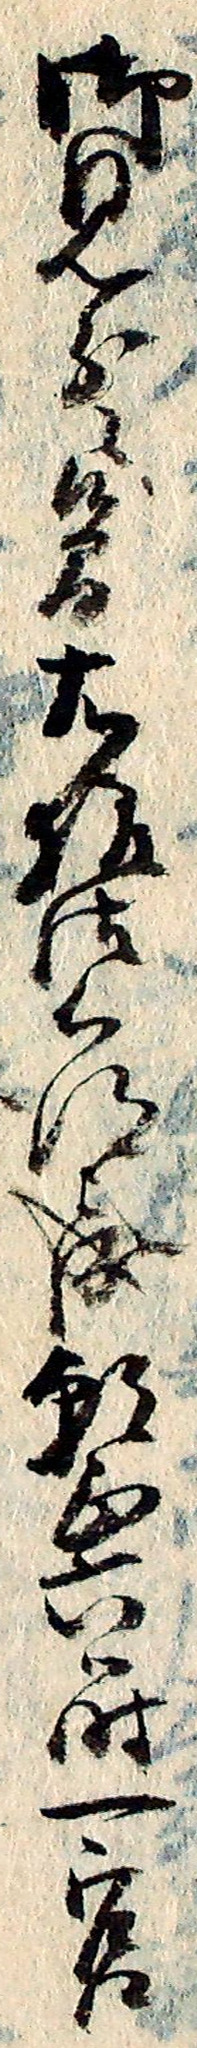御見分に候間右様御心得被成朝正六つ時一宮
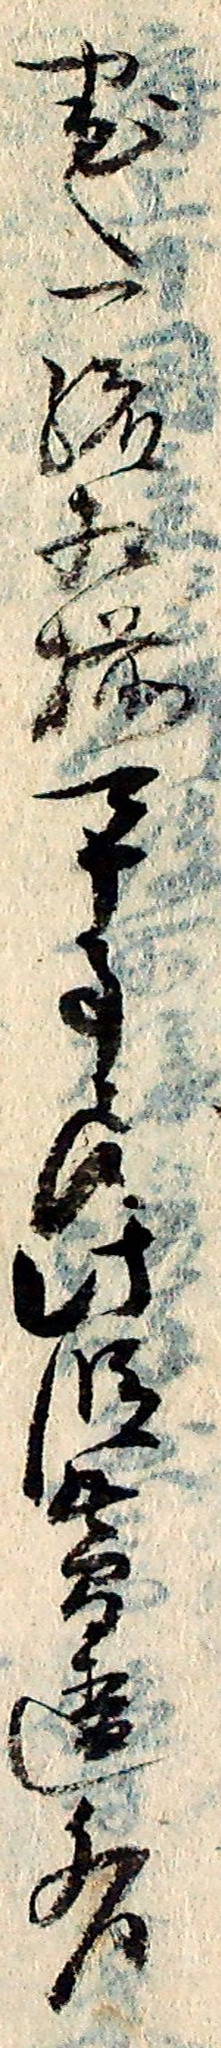宅へ一統相揃可申事に候此段無間違各
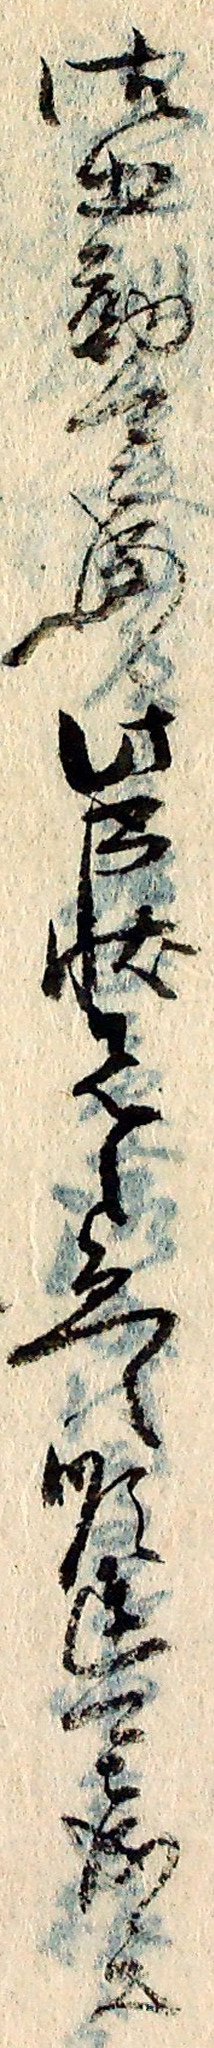御出勤可被成候此廻状先々急々順達可被成候以上
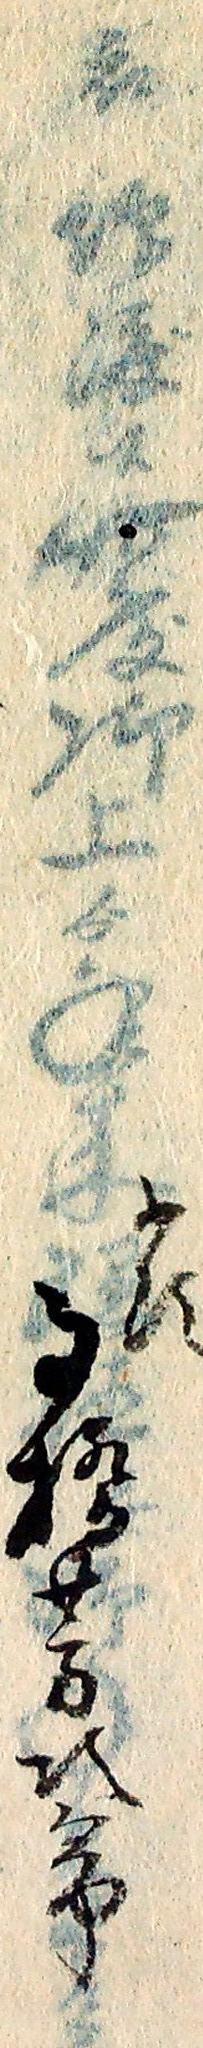高橋芳次郎
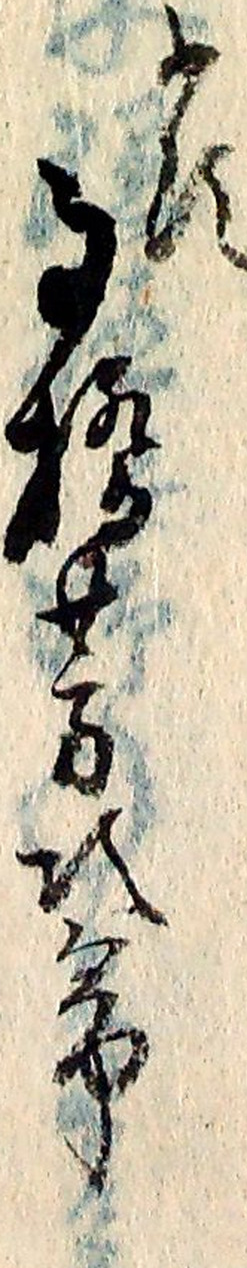高橋芳次郎
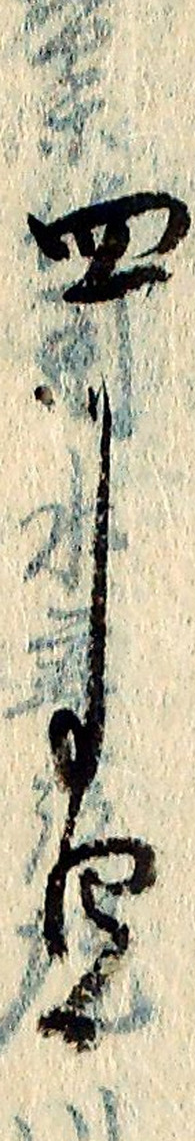四月四日
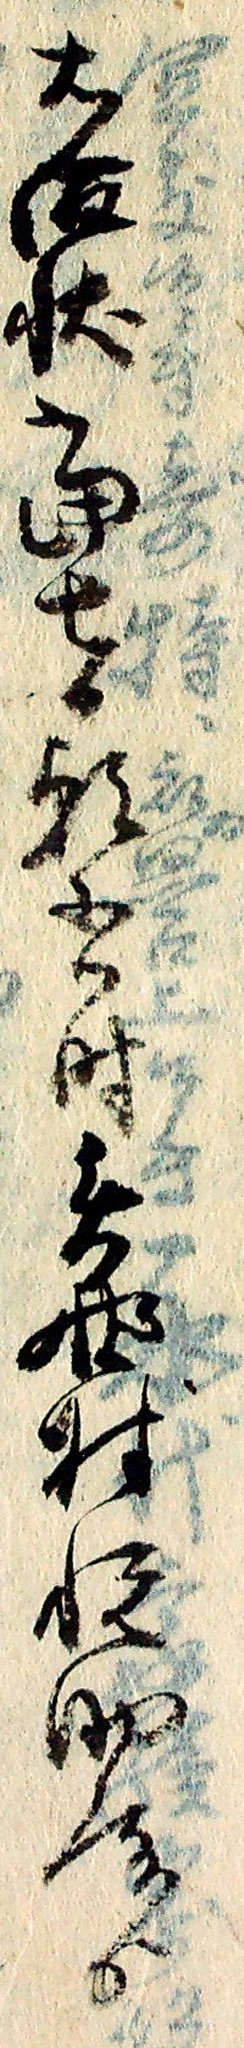右廻状当七日朝五つ時矢野村悦助殿ゟ
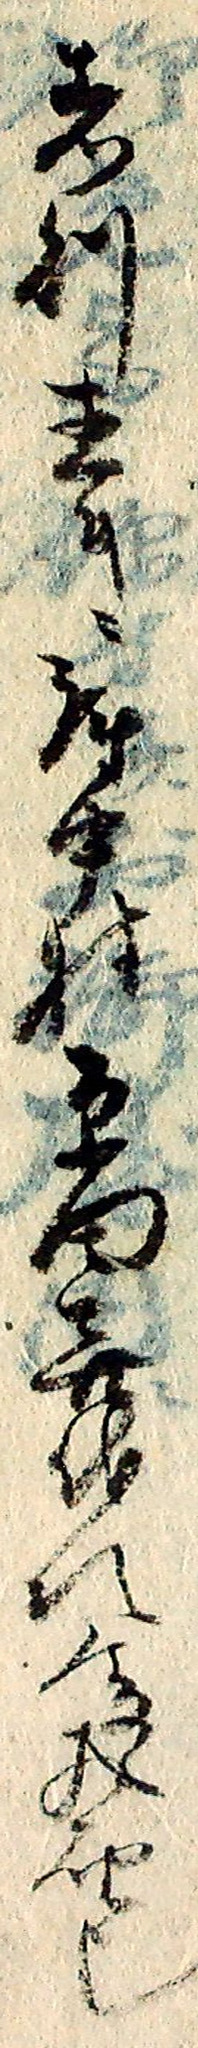着則直ちに府中村原田喜代次殿へ相届申候

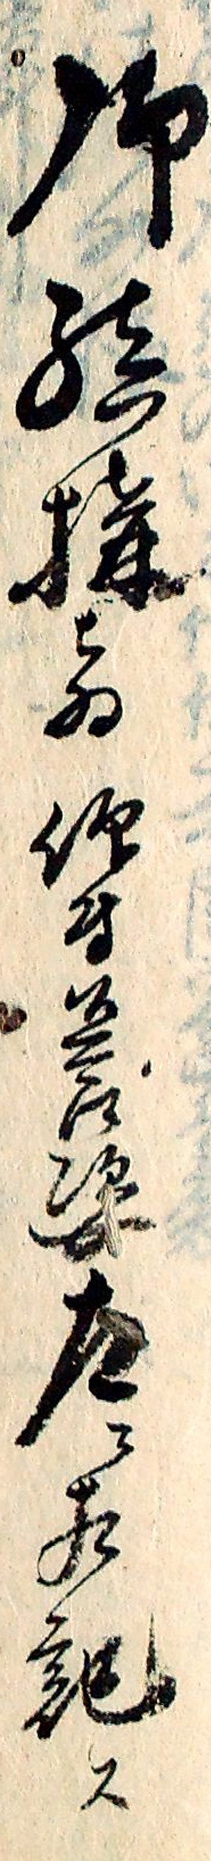御結構被為仰付候節姿左に相記す
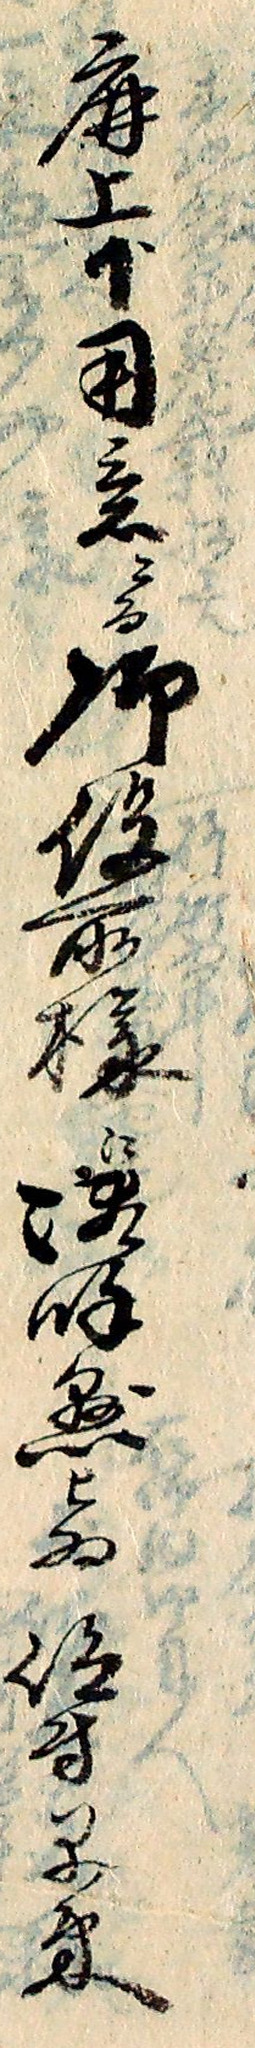麻上下用意にて御役所様え御呼懸被為仰付早速
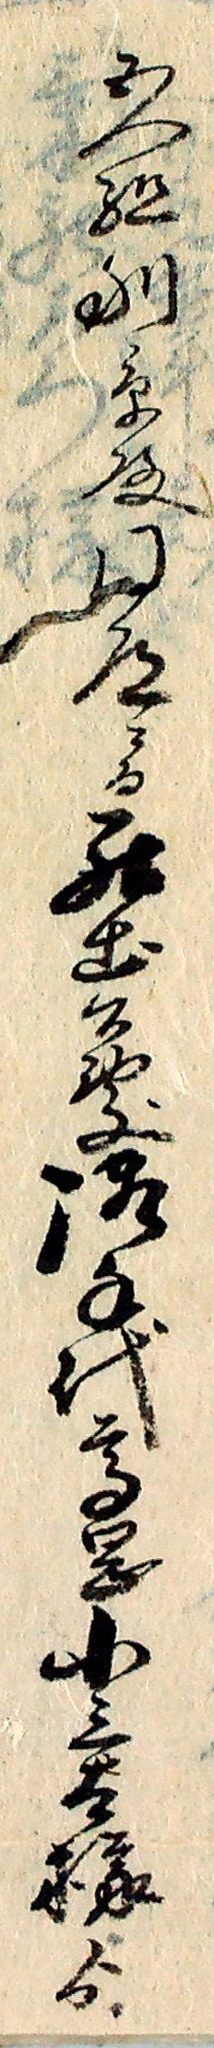五人組利兵衛殿同道にて罷出候処御手代高岡小三太様ゟ
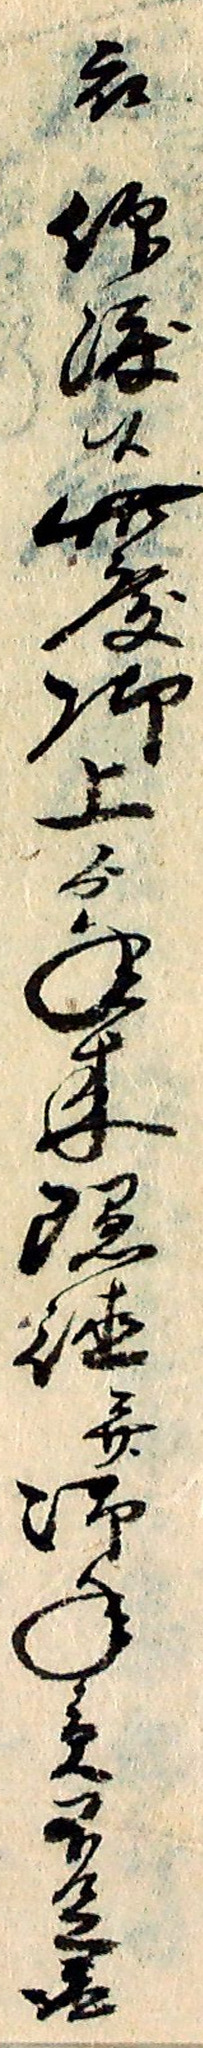被仰渡候此度御上ゟ年来隠徳并御年貢不足差
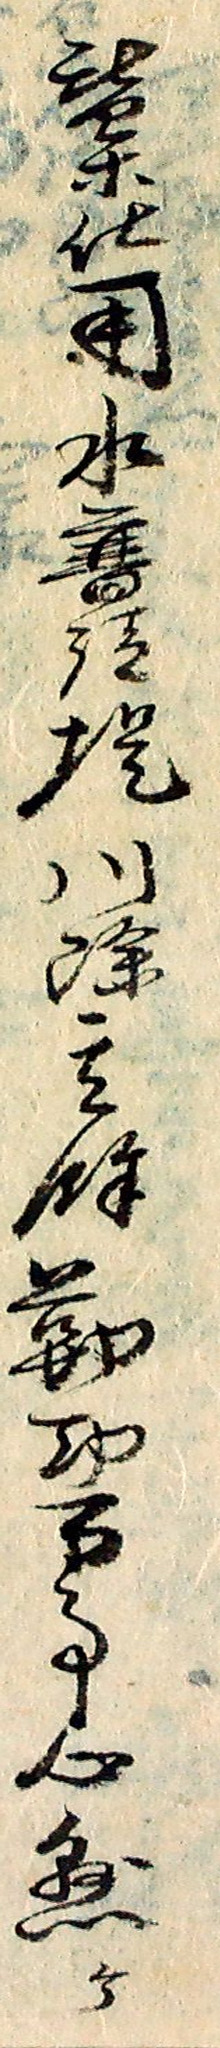替等仕用水普請堤川除其余勤功万事心懸け
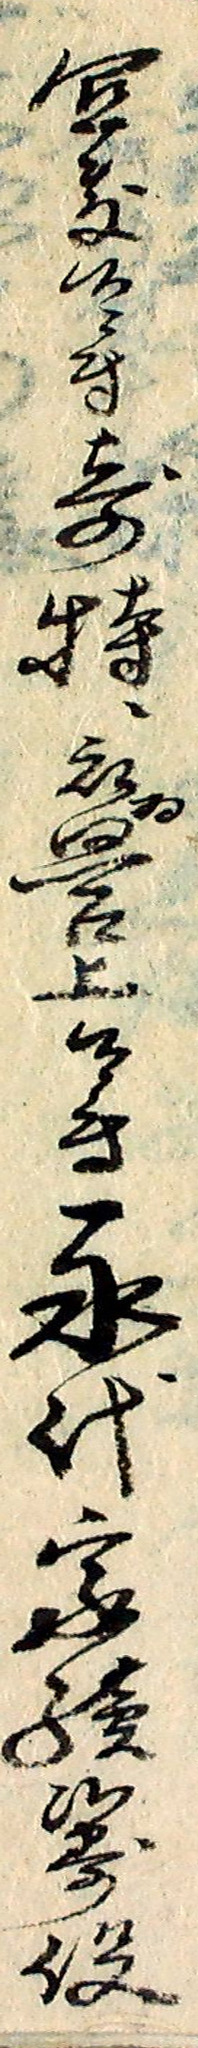宜敷候に付奇特に被為思召上候に付永代家続候寄役
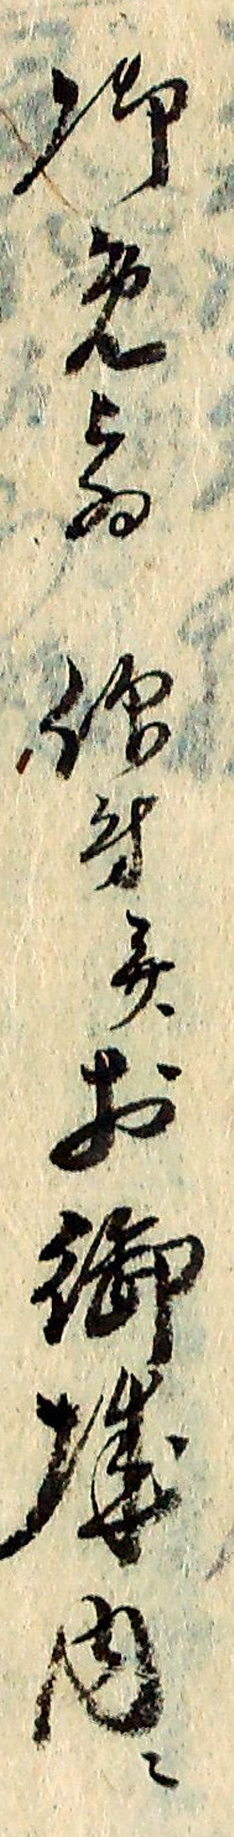御免被為仰付并於御城内に
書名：諸御願書控(後藤氏壱番）
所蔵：鳴門教育大学 Naruto University of Education
